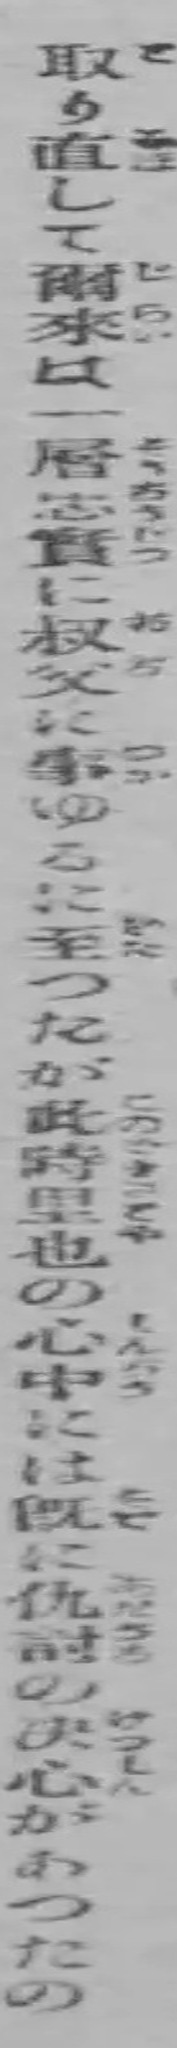取り直して爾来は一層忠実に叔父に事ゆるに至つたが此時里也の心中には既に仇討の決心があつたの
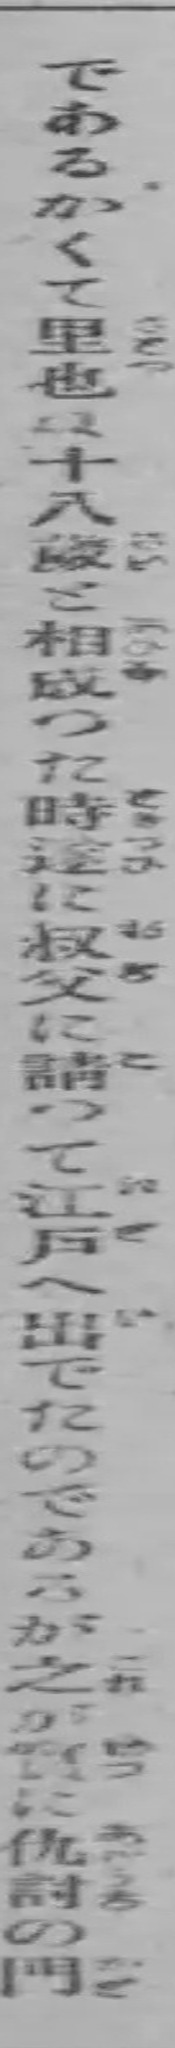であるかくて里也は十八歳と相成つた時遂に叔父に請つて江戸へ出でたのであるが之が実に仇討の門

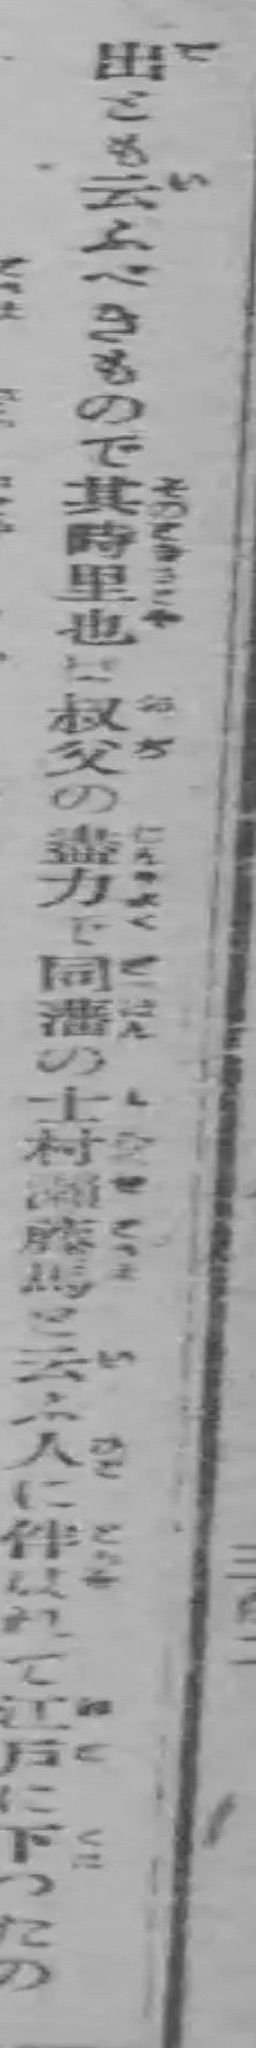出とも云ふべきもので其時里也は叔父の尽力で同藩の士村瀬藤馬と云ふ人に伴はれて江戸に下つたの
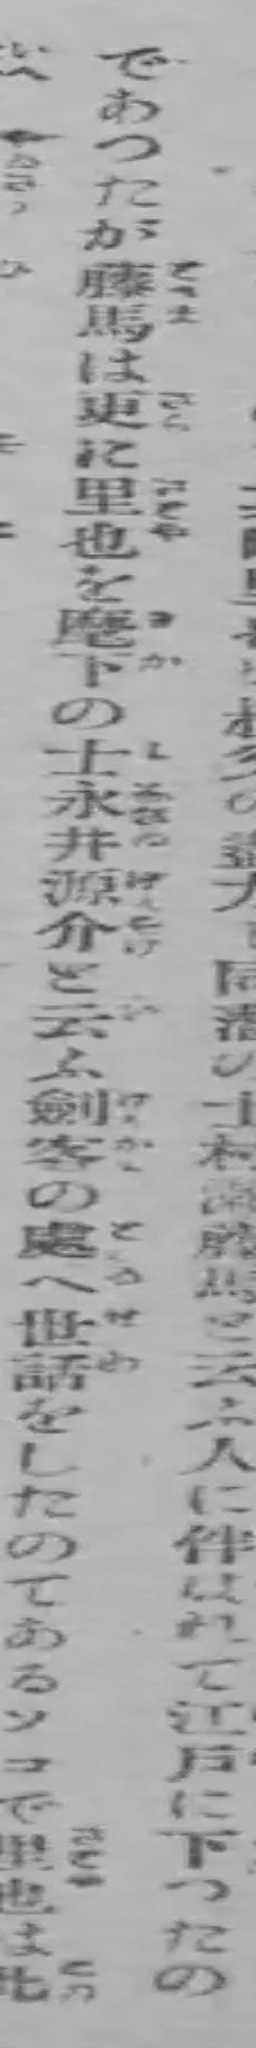であつたが藤馬は更に里也を麾下の士永井源介と云ふ剣客の処へ世話をしたのであるソコで里也は此
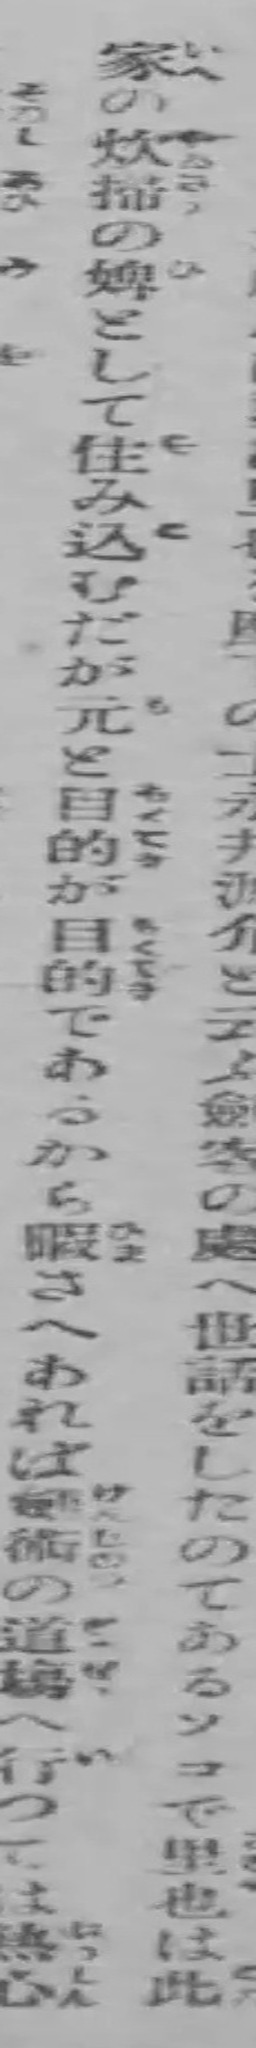家の炊掃の婢として住み込むだが元と目的が目的であるから暇さへあれば剣術の道場へ行つては熱心
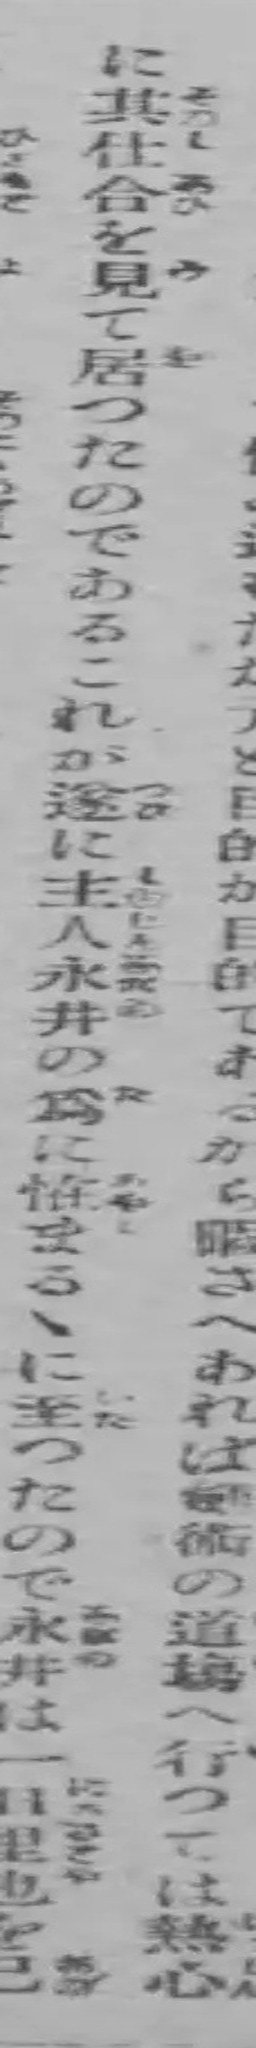に其仕合を見て居つたのであるこれが遂に主人永井の為に恠まるゝに至つたので永井は一日里也を己
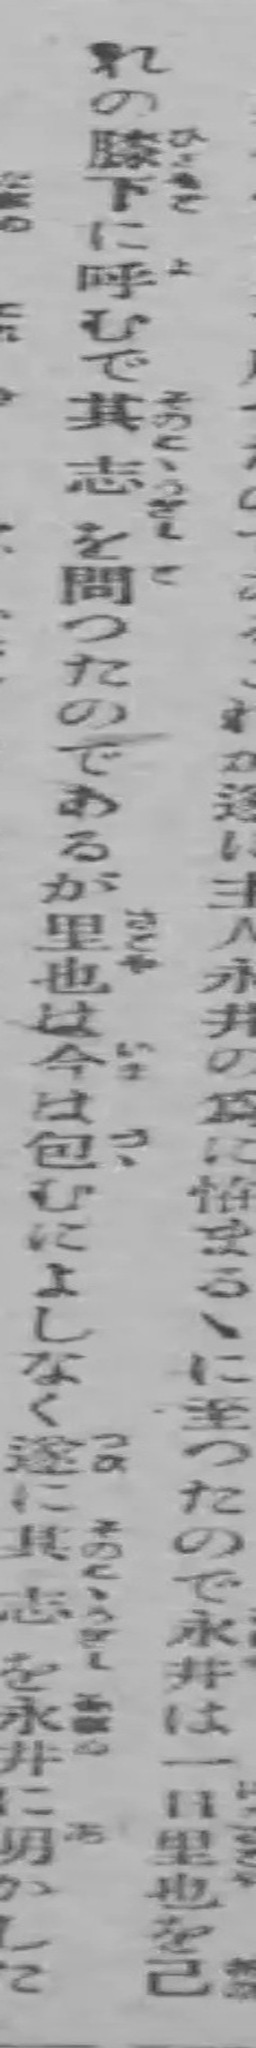れの膝下に呼むで其志を問つたのであるが里也は今は包むによしなく遂に其志を永井に明かした
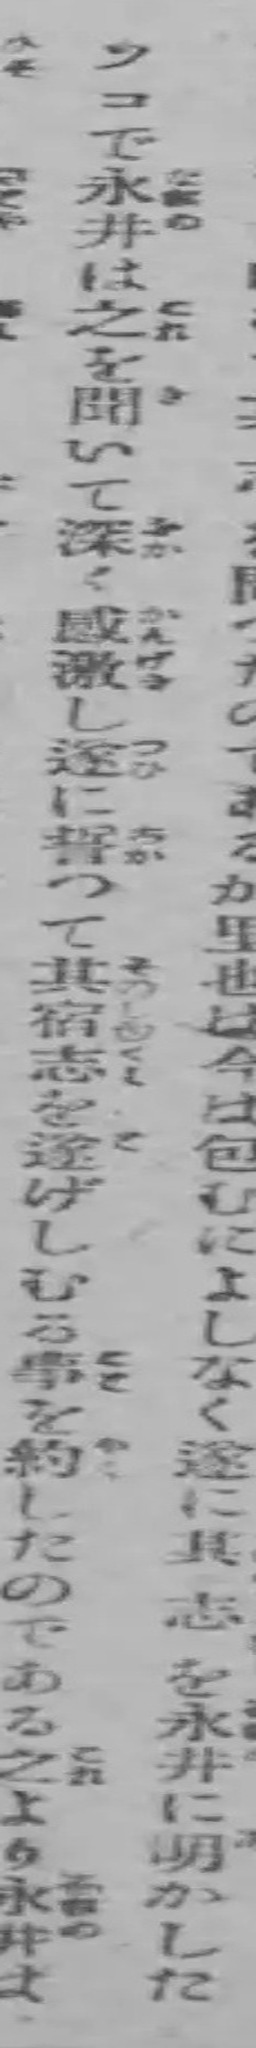ソコで永井は之を聞いて深く感激し遂に誓つて其宿志を遂げしむる事を約したのである之より永井は
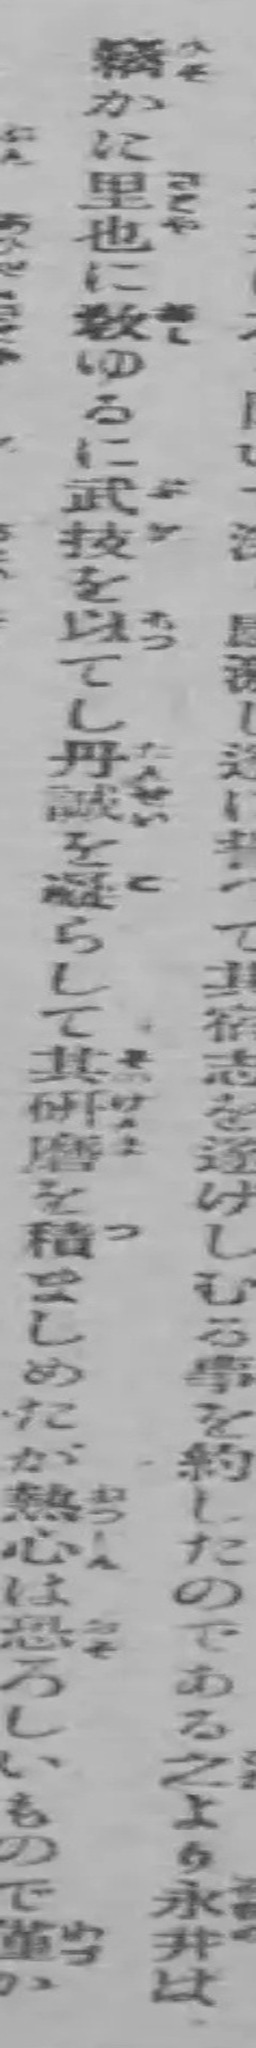竊かに里也に教ゆるに武技を以てし丹誠を凝らして其研磨を積ましめたが熱心は恐ろしいもので僅か
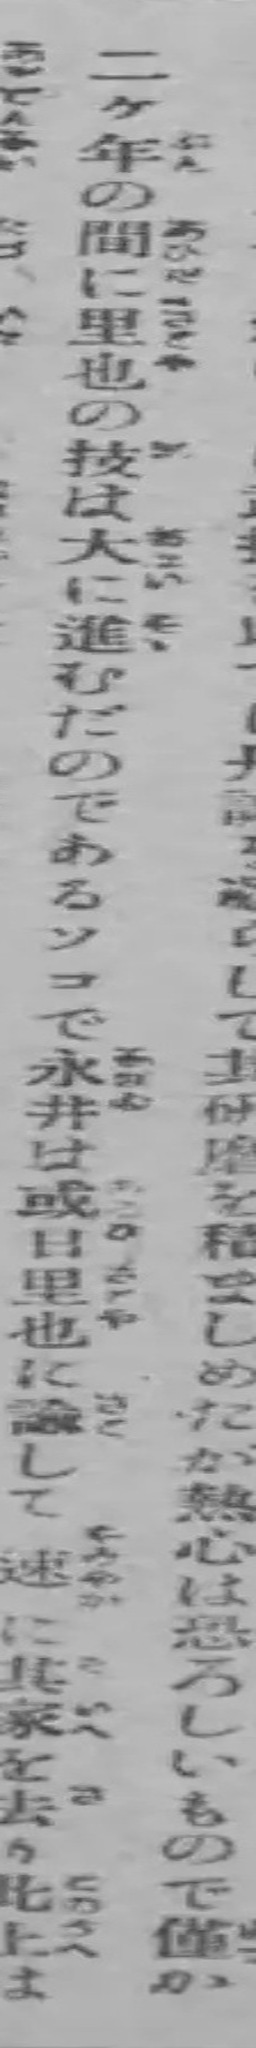二ケ年の間に里也の技は大に進むだのであるソコで永井は或日里也に諭して速に其家を去り此上は
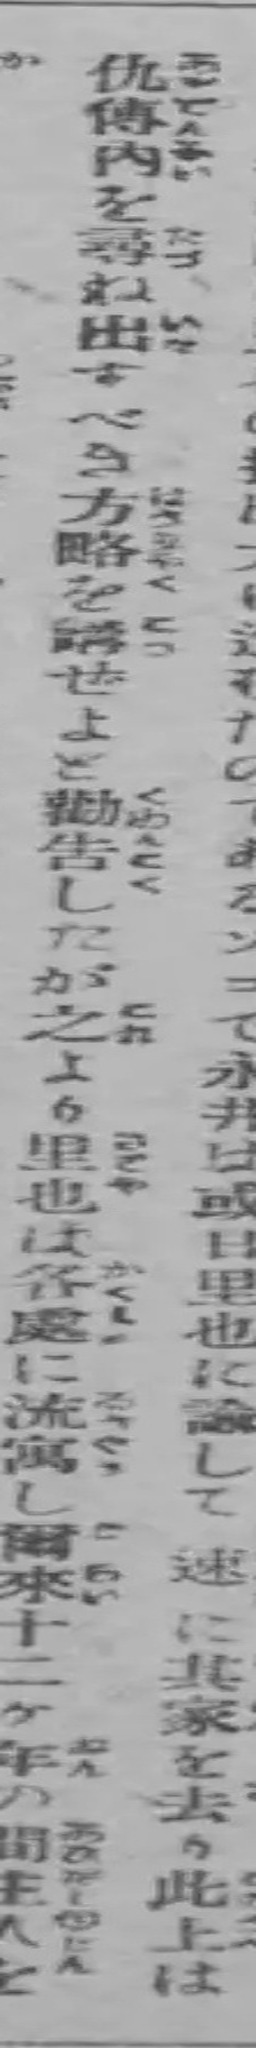仇伝内を尋ね出すべき方略を講ぜよと勧告したが之より里也は各処に流寓し爾来十二ケ年の間主人を
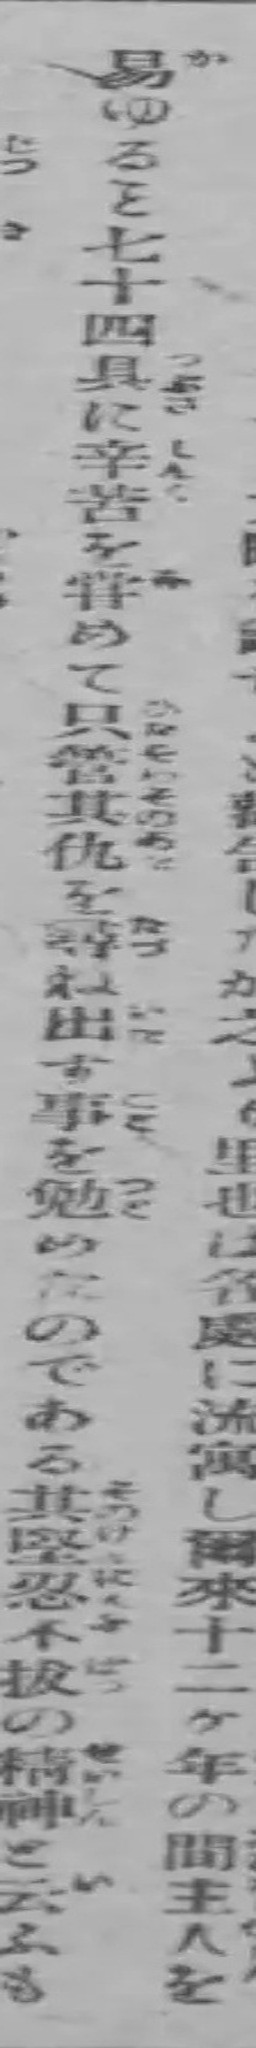易ゆること七十四具に辛苦を甞めて只管其仇を尋ね出す事を勉めたのである其堅忍不抜の精神と云ふも
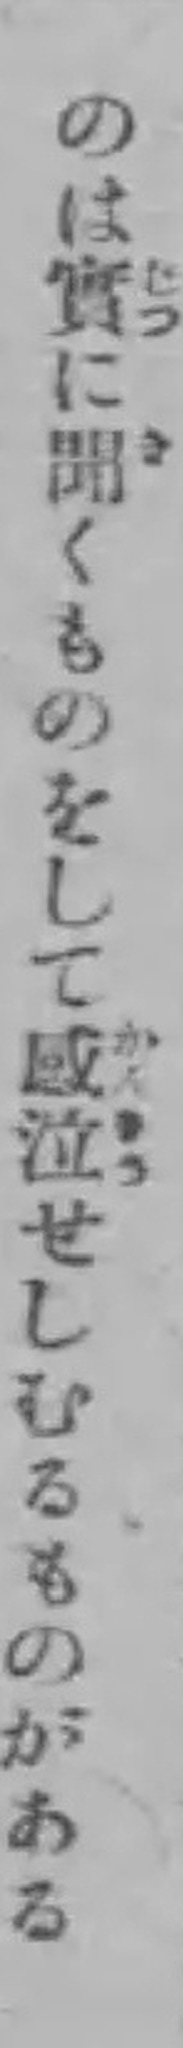のは実に聞くものをして感泣せしむるものがある
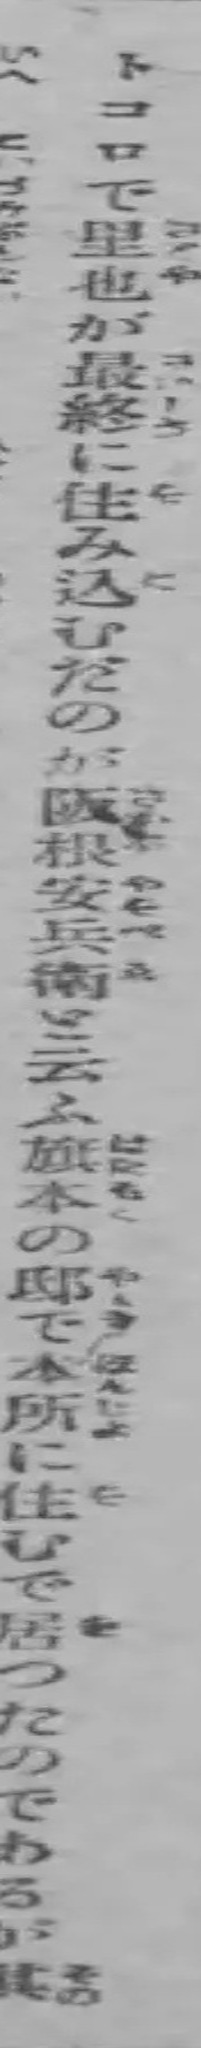トコロで里也が最終に住み込むだのが坂根安兵衛と云ふ旗本の邸で本所に住むで居つたのであるが其
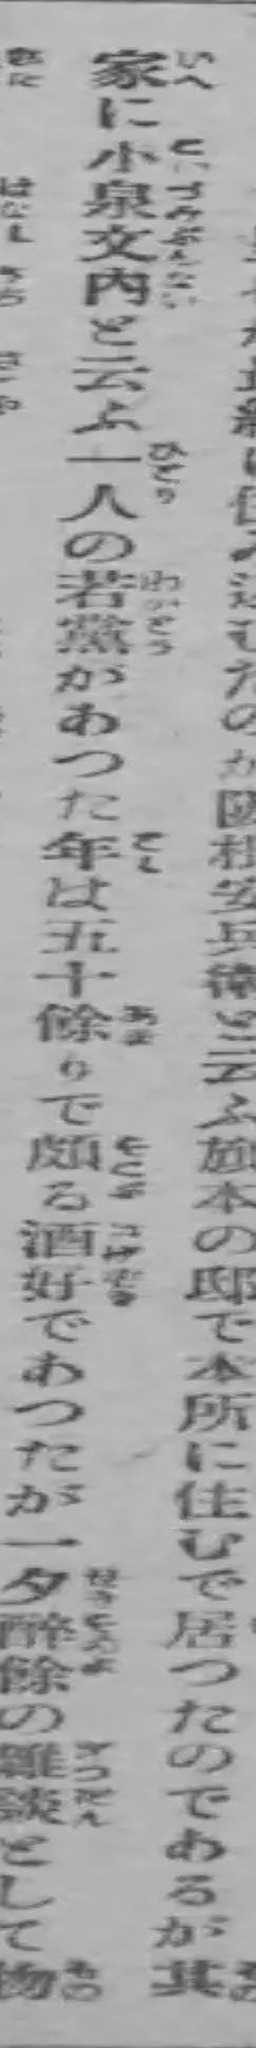家に小泉文内と云ふ一人の若党があつた年は五十余りで頗る酒好であつたが一夕酔余の雑談として物
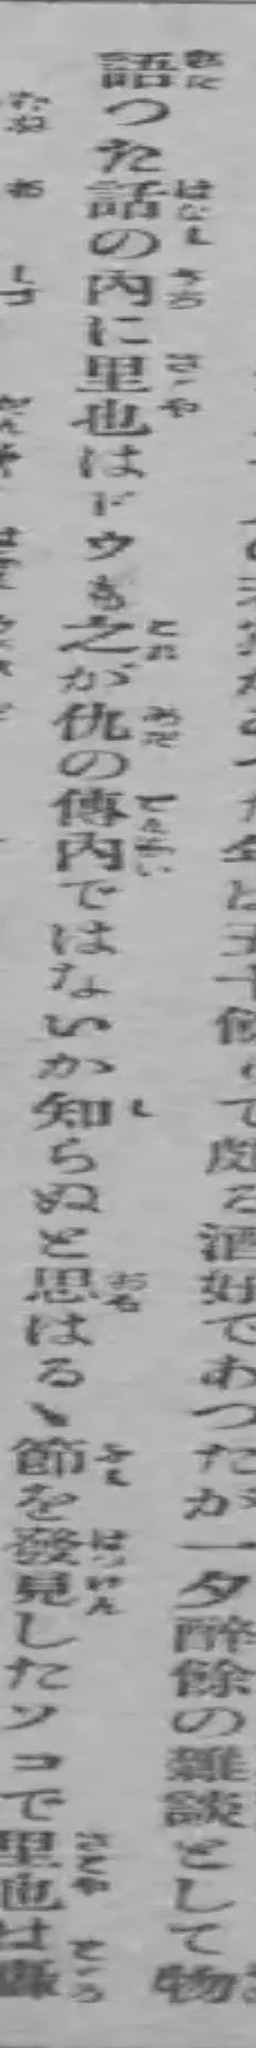語つた話の内に里也はドウも之が仇の伝内ではないか知らぬと思はるゝ節を発見したソコで里也は轟
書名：豊橋市史談
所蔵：国立国会図書館 National Diet Library, JAPAN
